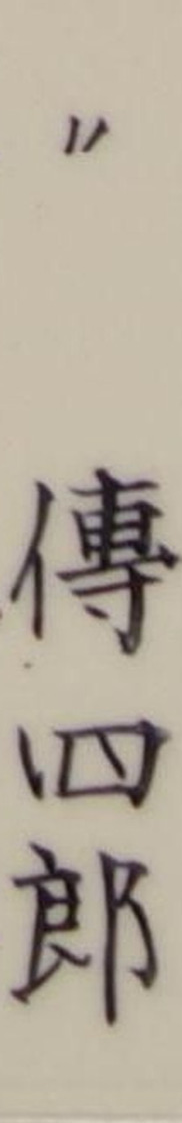傳四郎
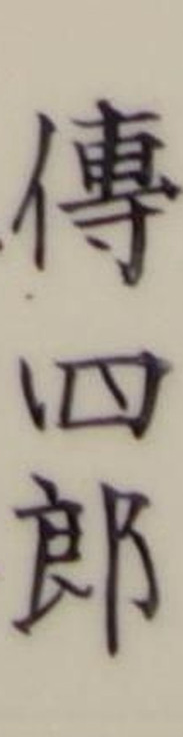傳四郎
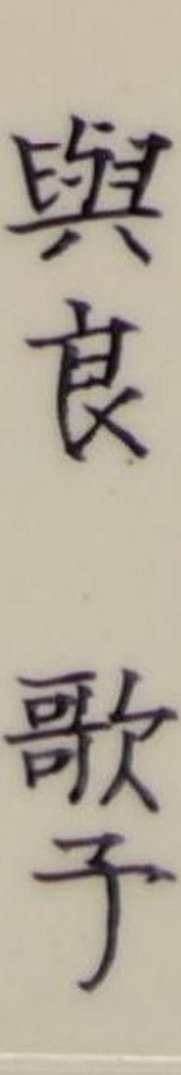與良歌子
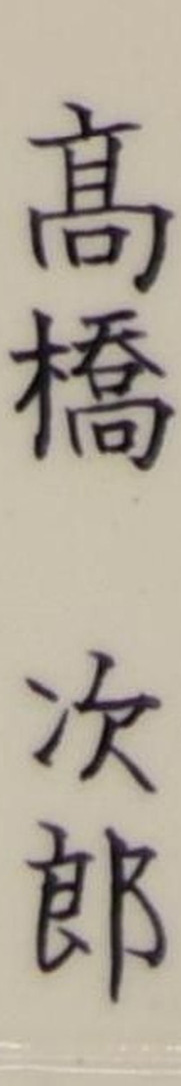高橋次郎
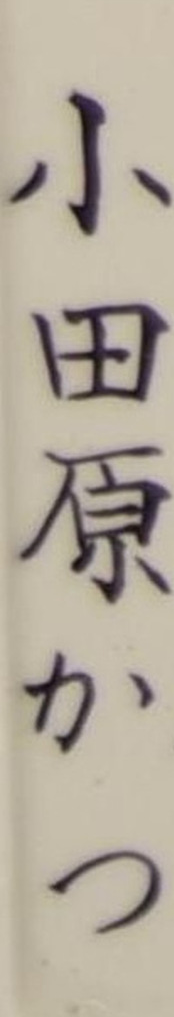小田原かつ

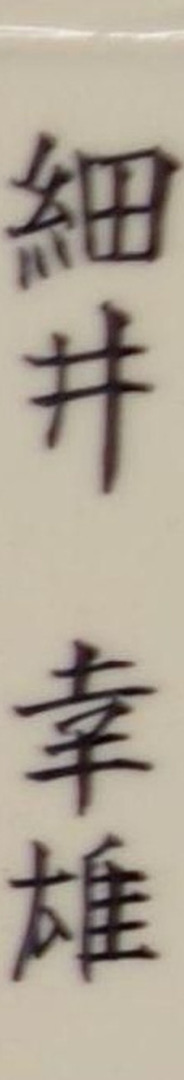細井幸雄
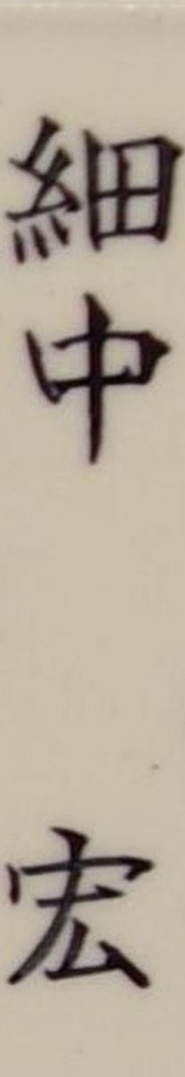細中宏
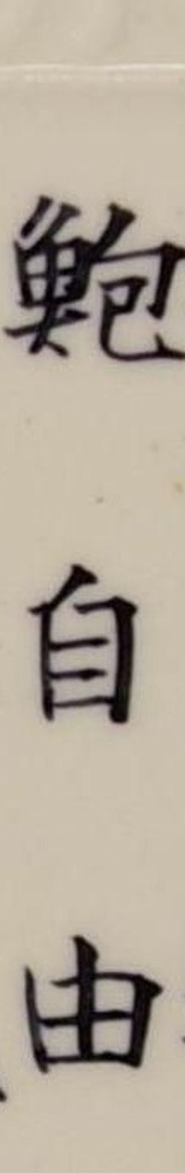鮑自由
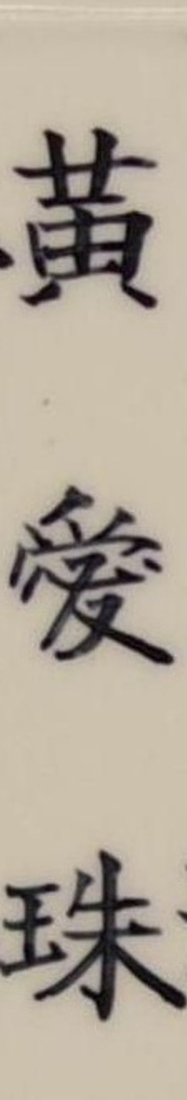黄愛珠
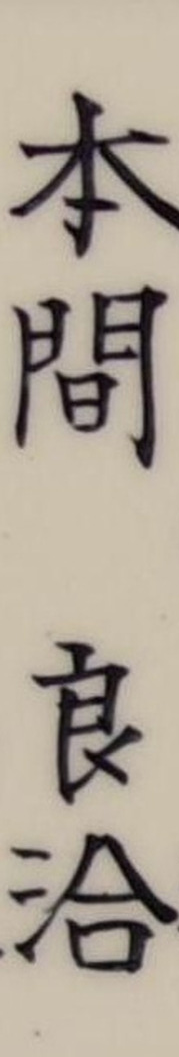本間良治
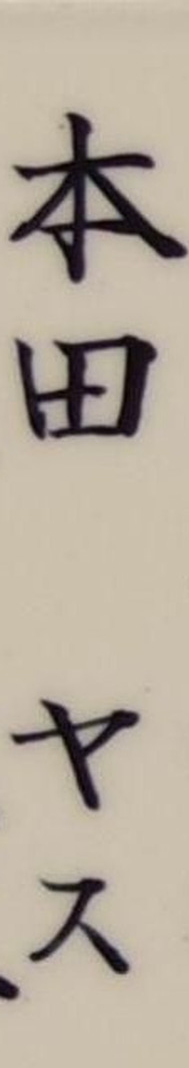本田ヤス
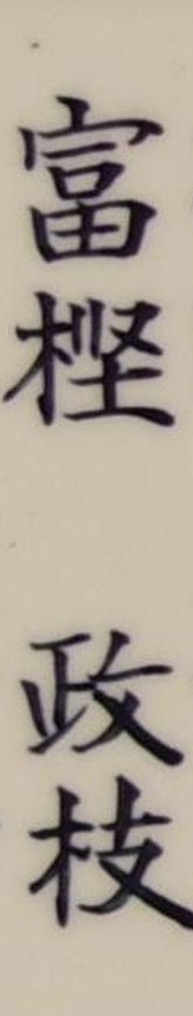富樫政枝
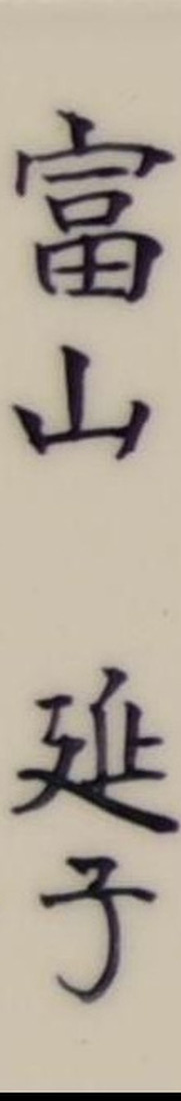富山延子
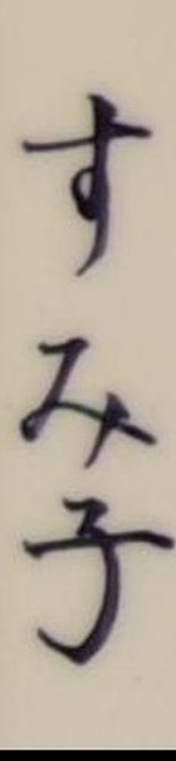すみ子

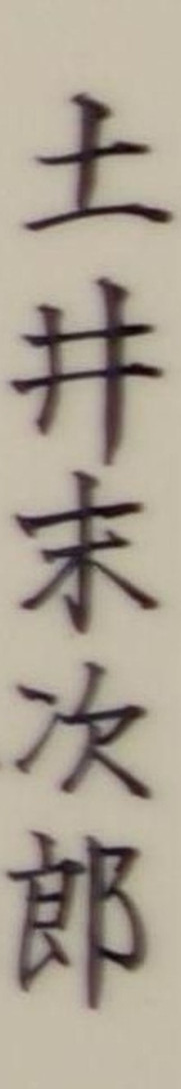土井末次郎
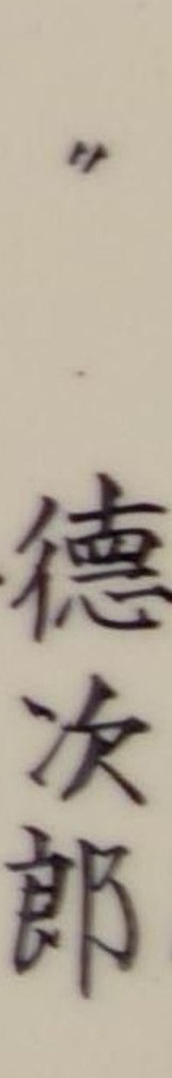徳次郎
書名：E~L
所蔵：高野山金剛峯寺
